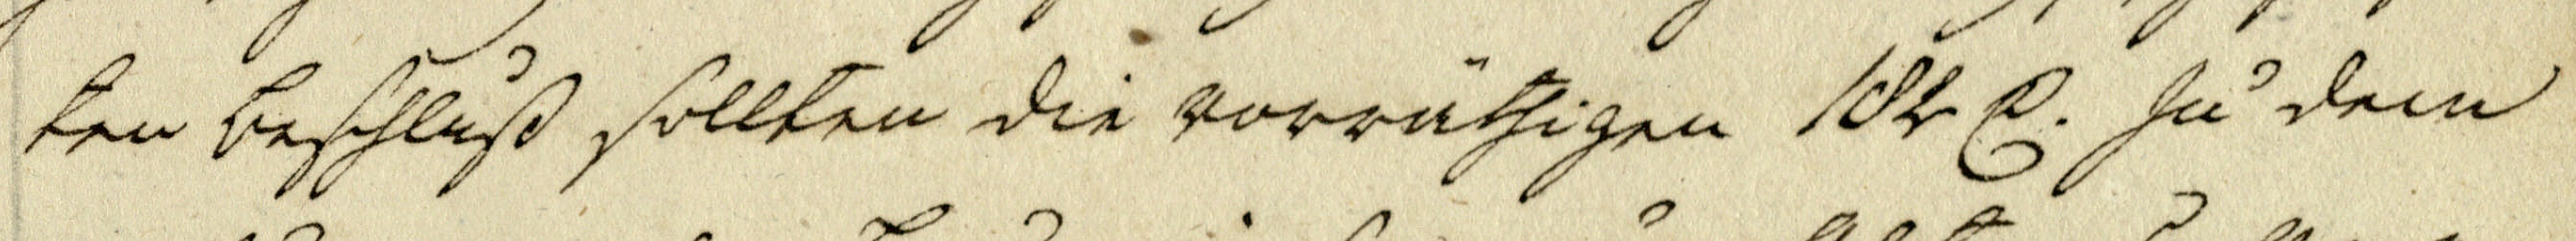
ten Beschluß sollten die vorräthigen 182 l. zu dem
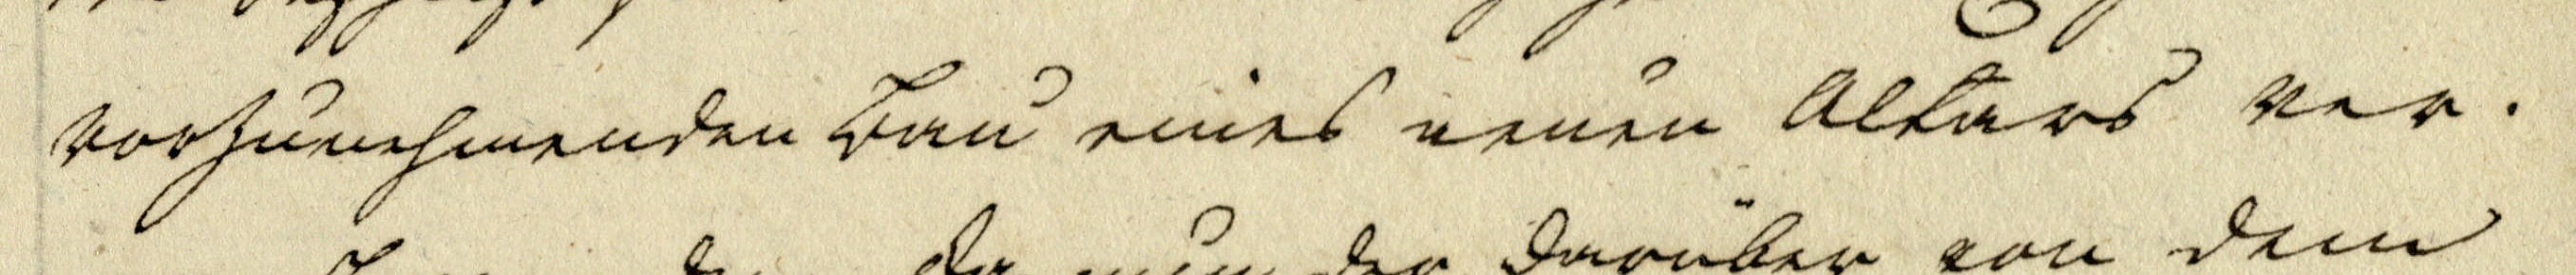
vorzunehmenden Bau eines neuen Altars ver¬
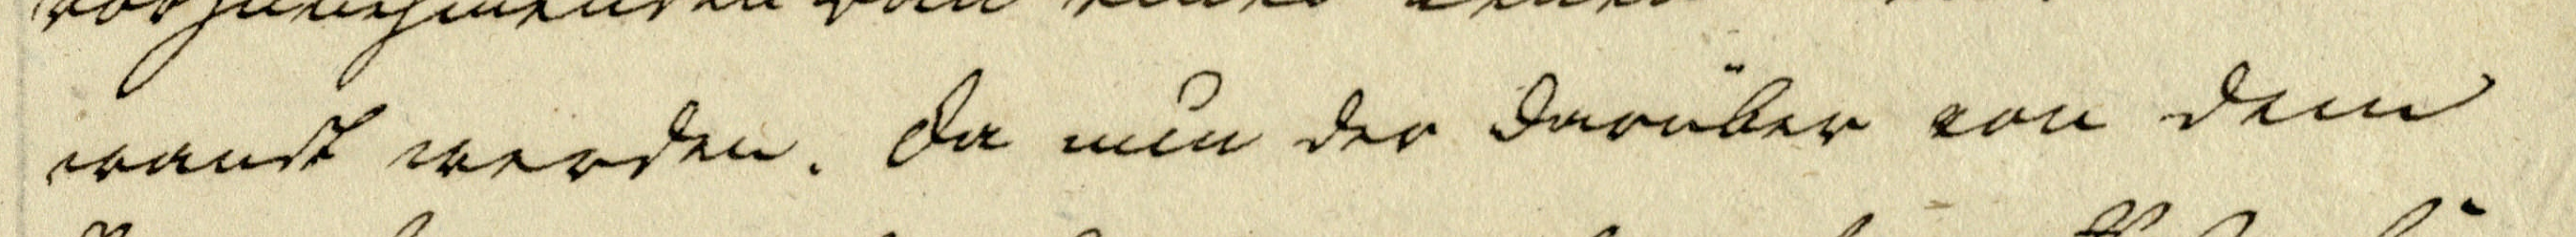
wandt werden. Da nun der darüber von dem
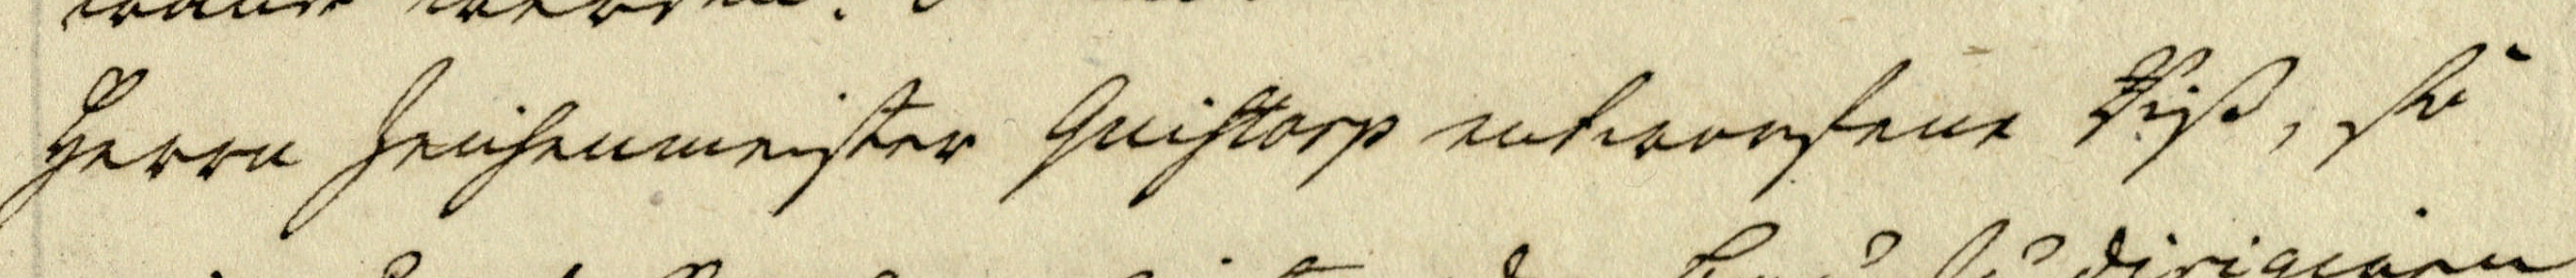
Herrn Zeichenmeister Quistorp entworfene Riß, so
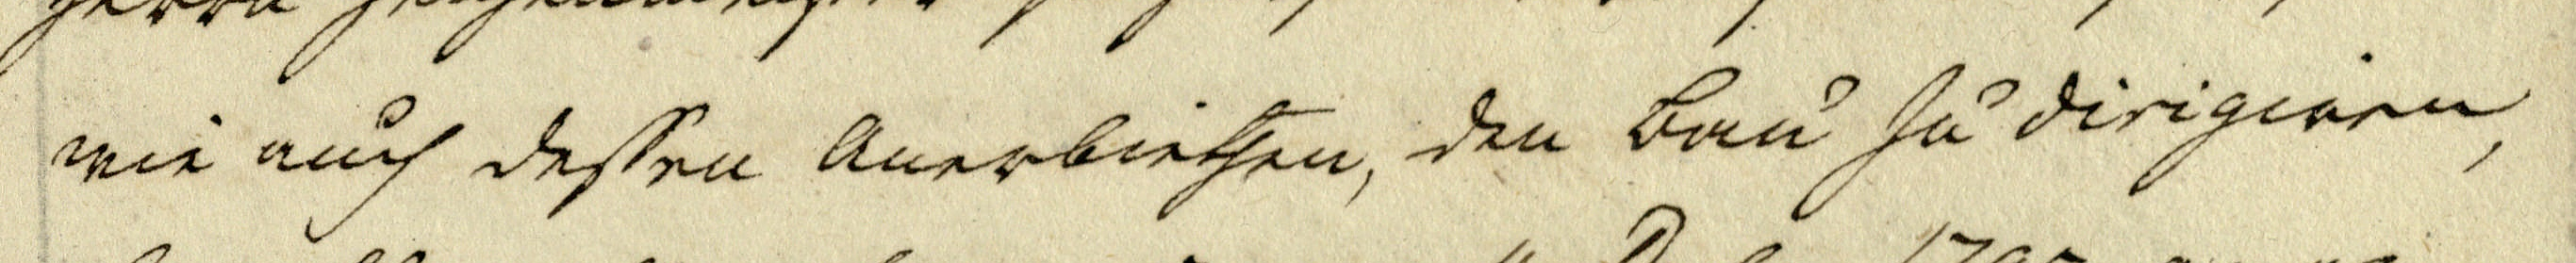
wie auch dessen Anerbiethen, den Bau zu dirigiren,
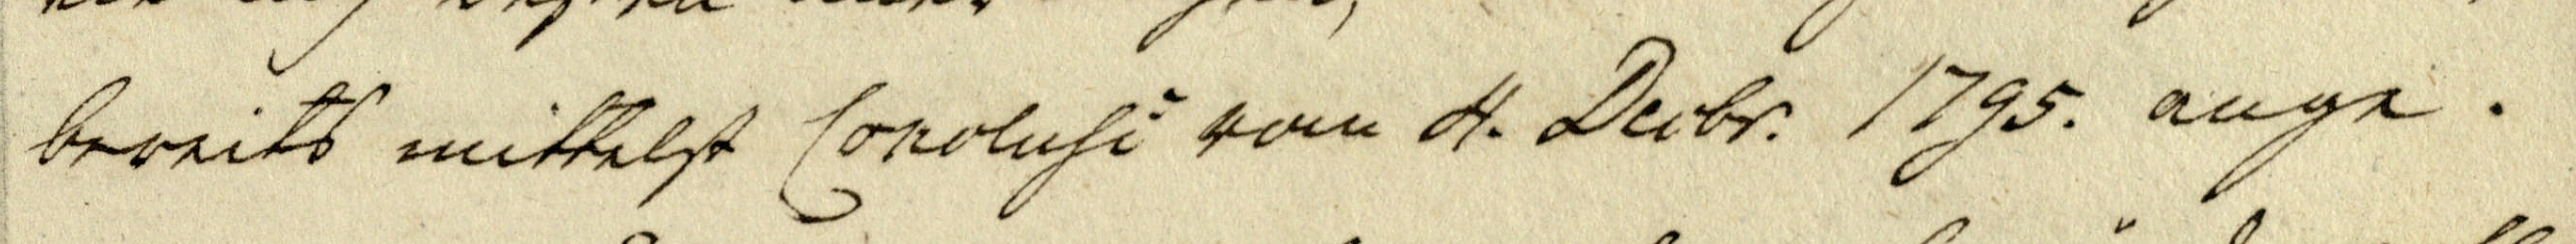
bereits mittelst Conclusi vom 4. Decbr. 1795. ange¬
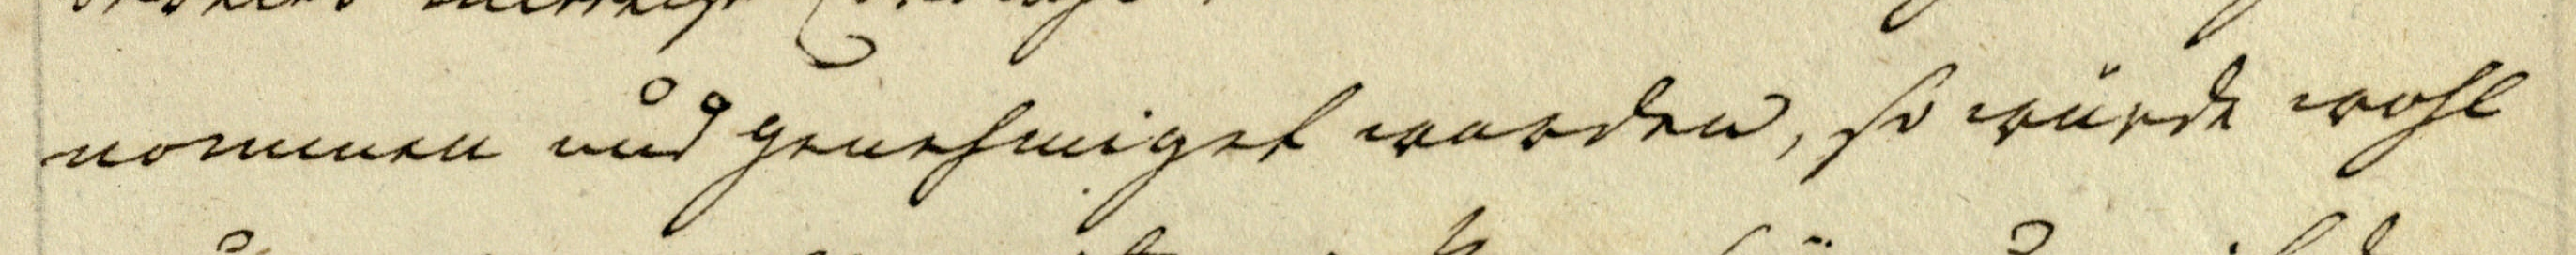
nommen und genehmiget worden, so würde wohl
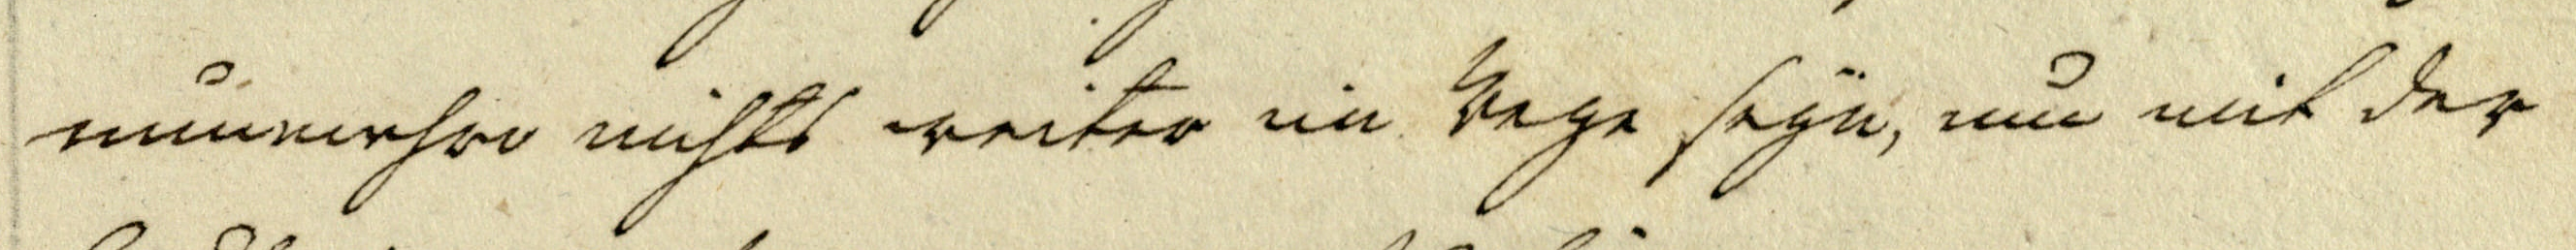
nunmehro nichts weiter im Wege seÿn, nun mit der
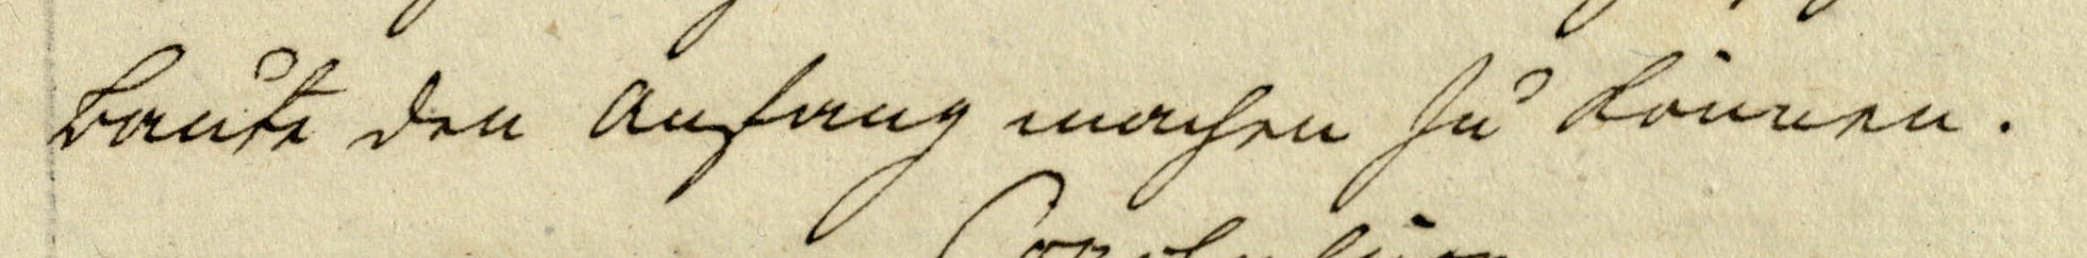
Baute den Anfang machen zu können.
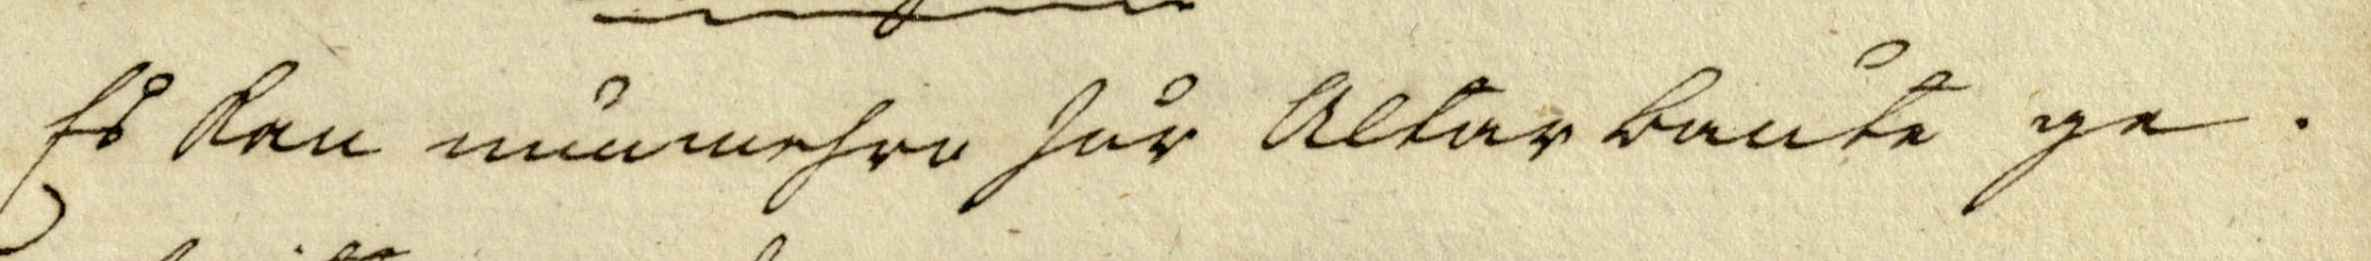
Es kan nunmehro zur Altar Baute ge¬
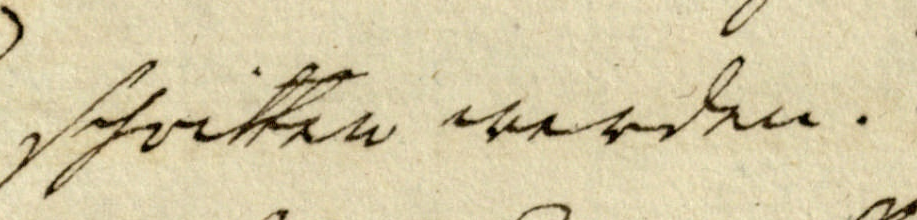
schritten werden.
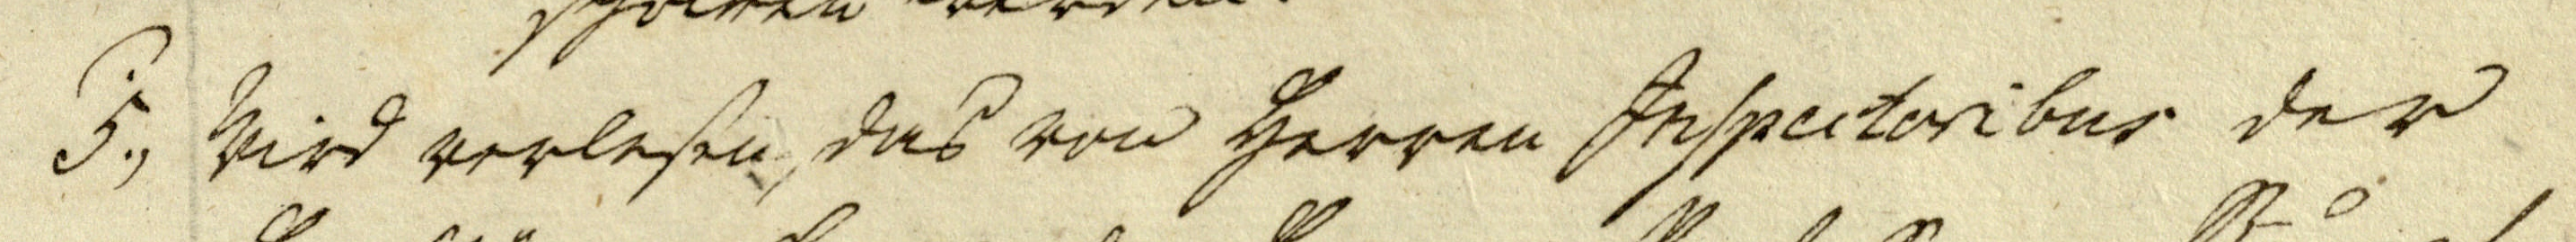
5., Wird verlesen, das von Herren Inspectoribus der
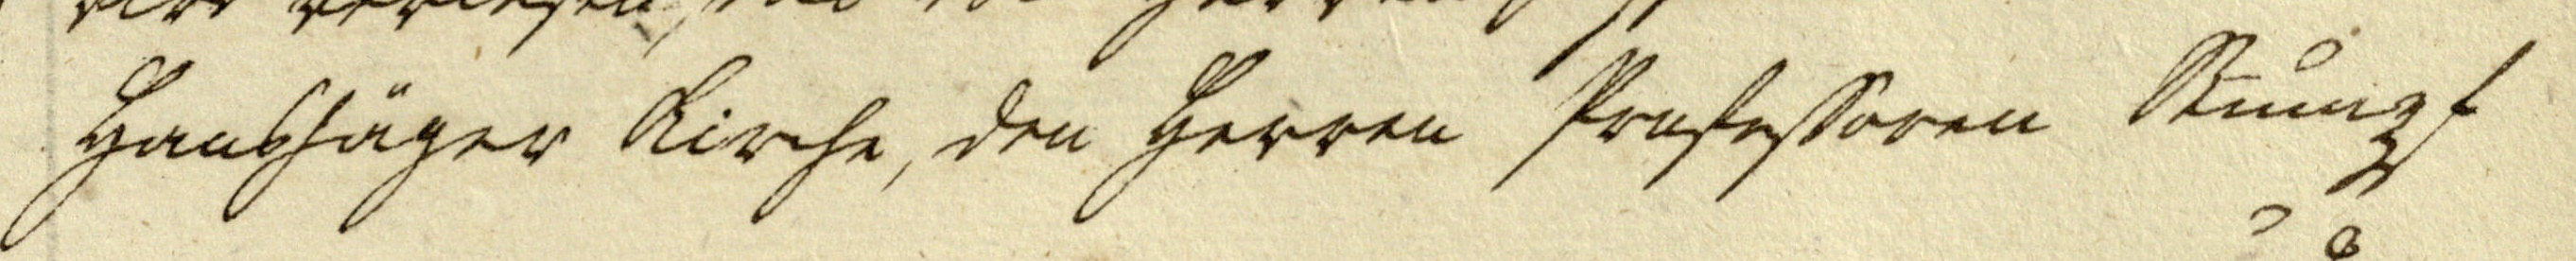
Hanshäger Kirche, den Herren Professoren Stumpf
